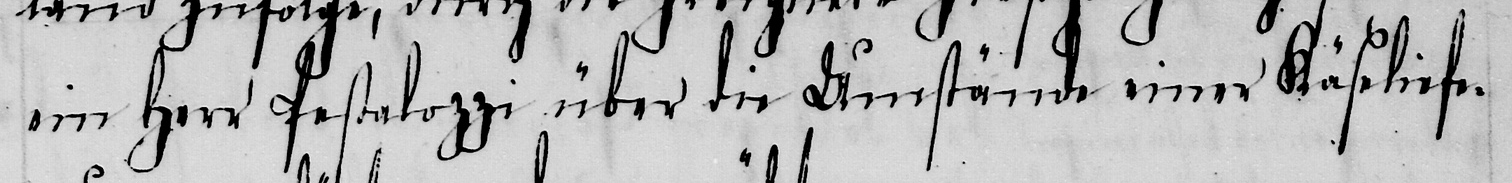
ein Herr Pestalozzi über die Umstände einer Käseliefe¬
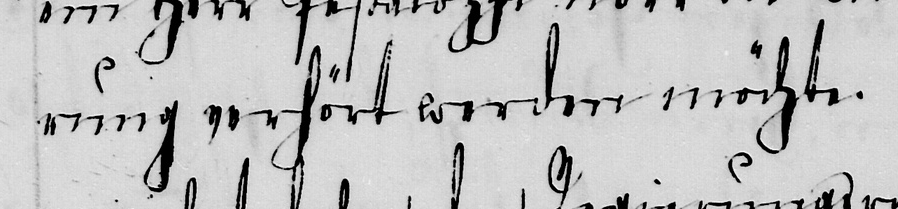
rung verhört werden möchte.
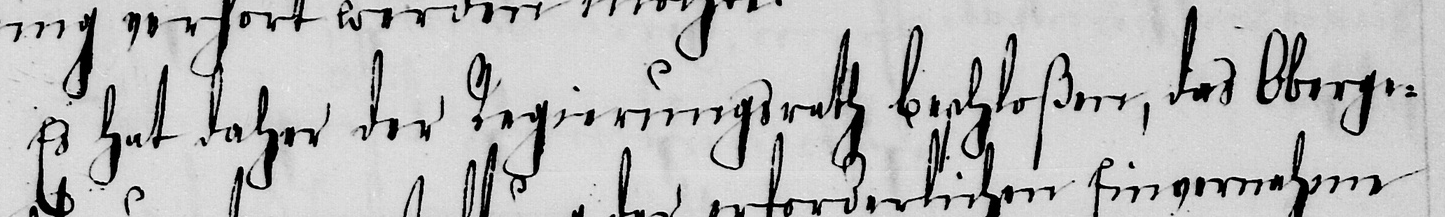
Es hat der Regierungsrath beschloßen, das Oberge¬
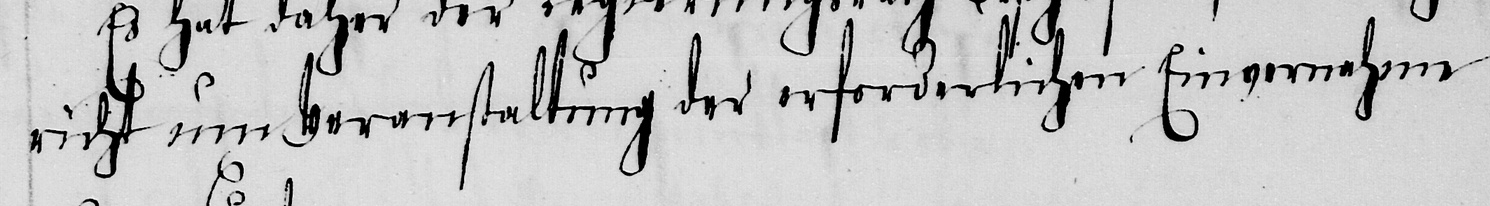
richt um Veranstaltung der erforderlichen Einvernahme
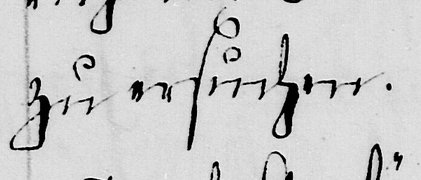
zu ersuchen.
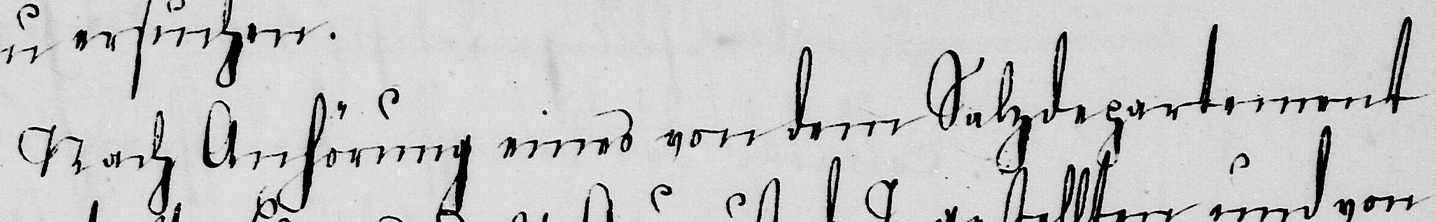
Nach Anhörung eines von dem Salzdepartement
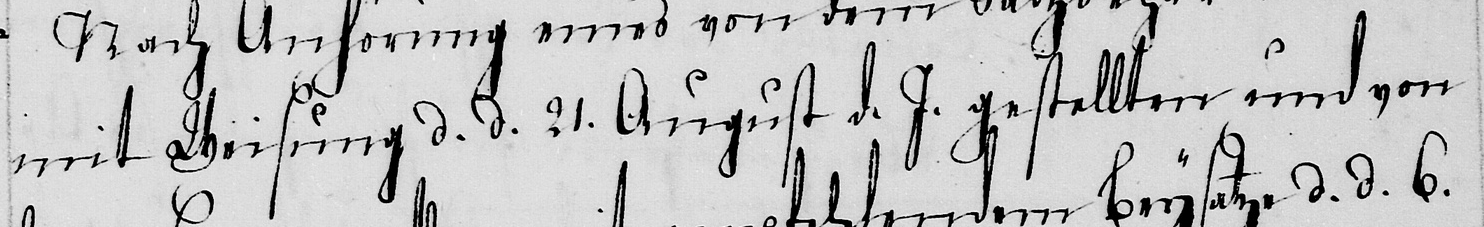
mit Weisung d. d. 21. August d. J. gestellten und von
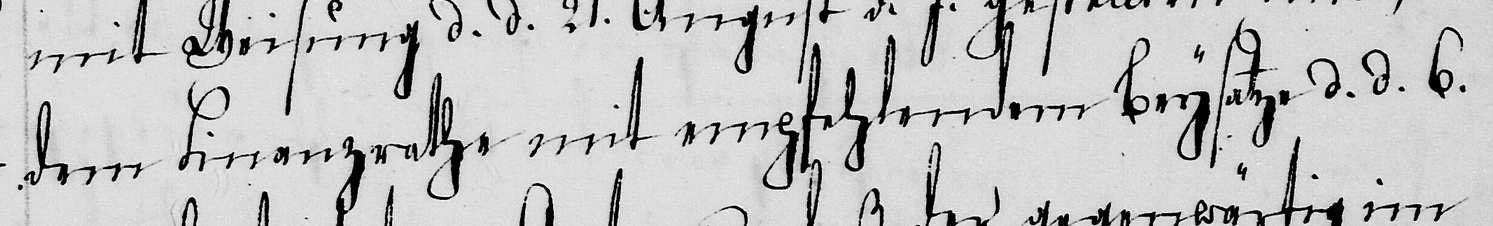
dem Finanzrathe mit empfehlendem Beysatze d. d. 6.
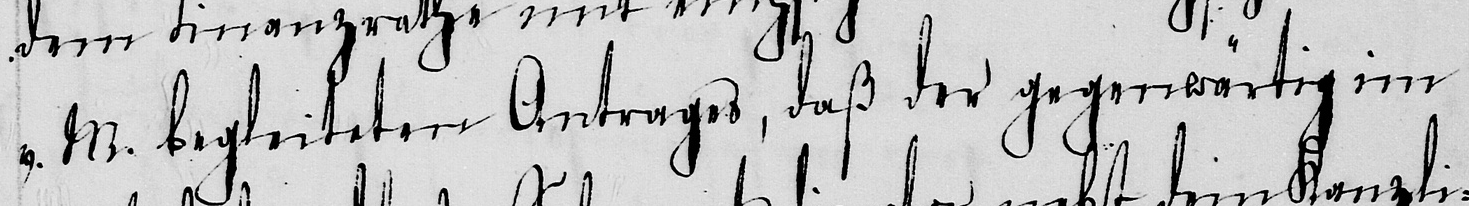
v. M. begleiteten Antrages, daß der gegenwärtig im
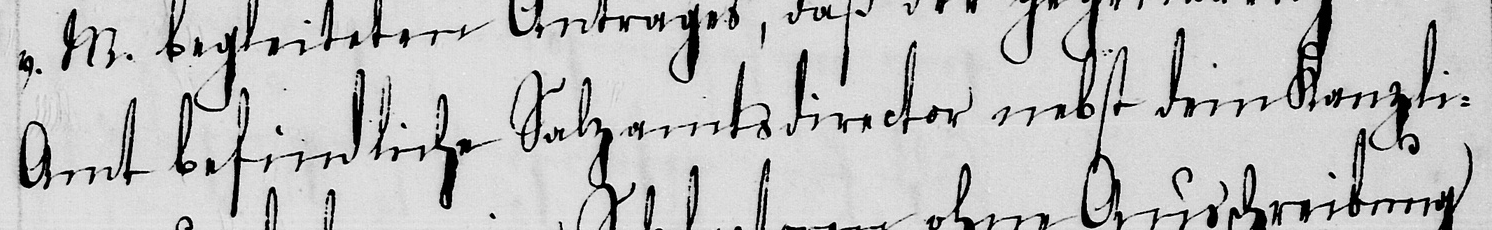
Amt befindliche Salzamtsdirector nebst dem Kanzli¬
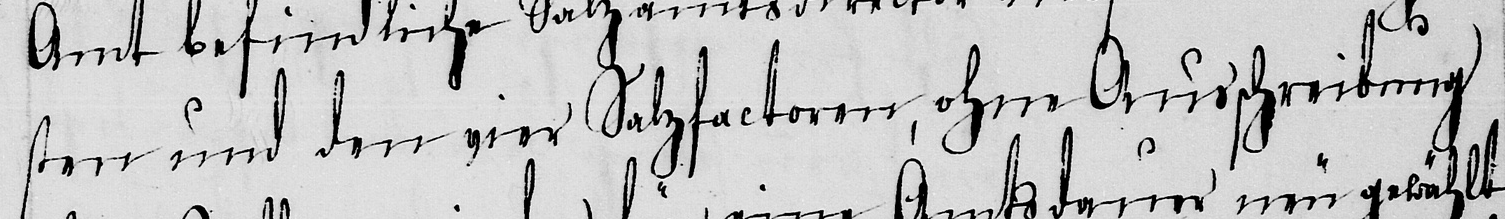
sten und den vier Salzfactoren, ohne Ausschreibung
